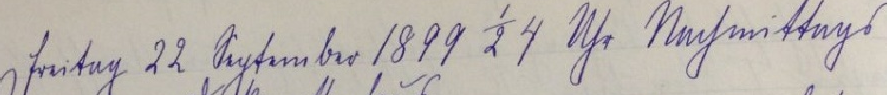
Freitag 22. September ¼ 4 Uhr Nachmittags
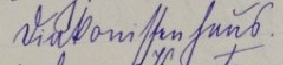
Diakonissenhaus
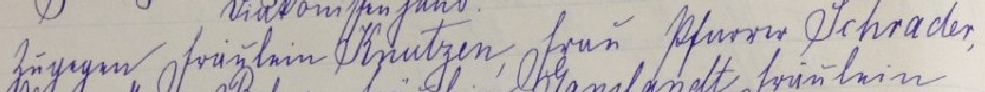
Zugegen: Fäulein Knutzen, Frau Pfarrer Schrader,
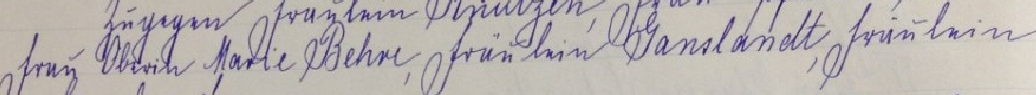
Frau Oberin Marie Behre, Fräulein Ganslandt, Fräulein
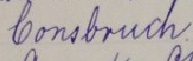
Consbruck
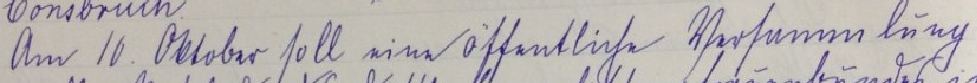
Am 10 Oktober soll eine öffentliche Versammlung für
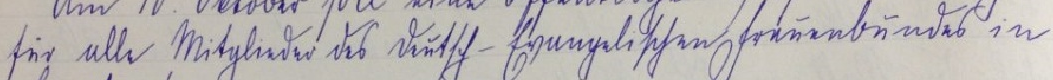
alle Mitglieder des Deutsch-Evangelischen Frauenbundes in
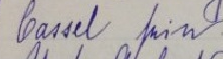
Cassel sein.
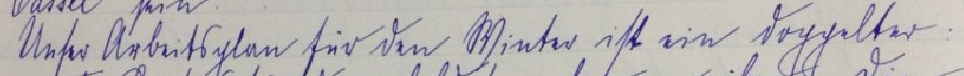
Unser Arbeitsplan für den Winter ist ein doppelter.
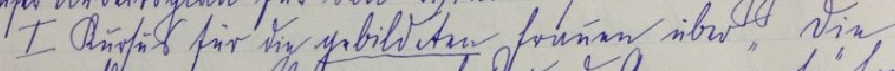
I Kursus für die gebildeten Frauen über „Die
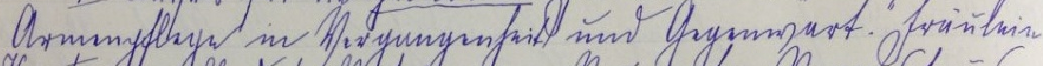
Armenpflege in Vergangenheit und Gegenwart". Fräulein
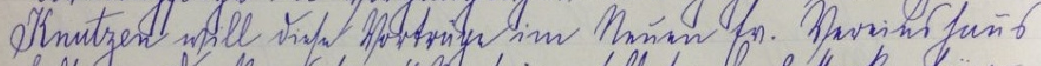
Knutzen will diese Vorträge im neuen Ev. Vereinshaus
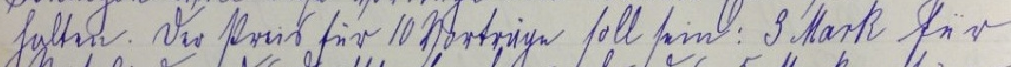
halten. Der Preis für 10 Vorträge soll sein: 3 Mark für
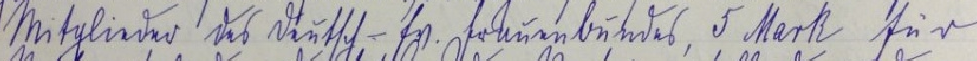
Mitglieder des Deutsch-Ev. Frauenbundes, 5 Mark für
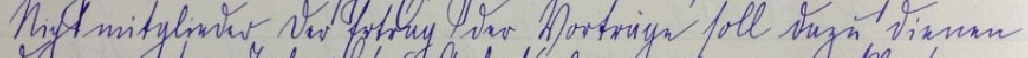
Nichtmitglieder. Der Ertrag der Vorträge soll dazu dienen
